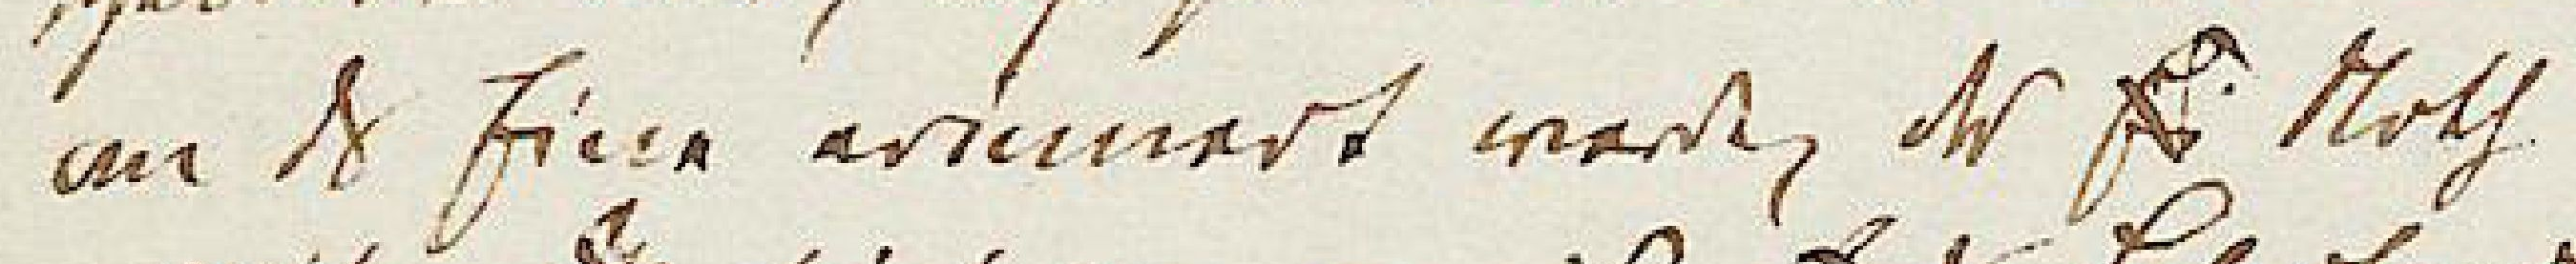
an ds Eine erinnert werde, ds Ei Noth
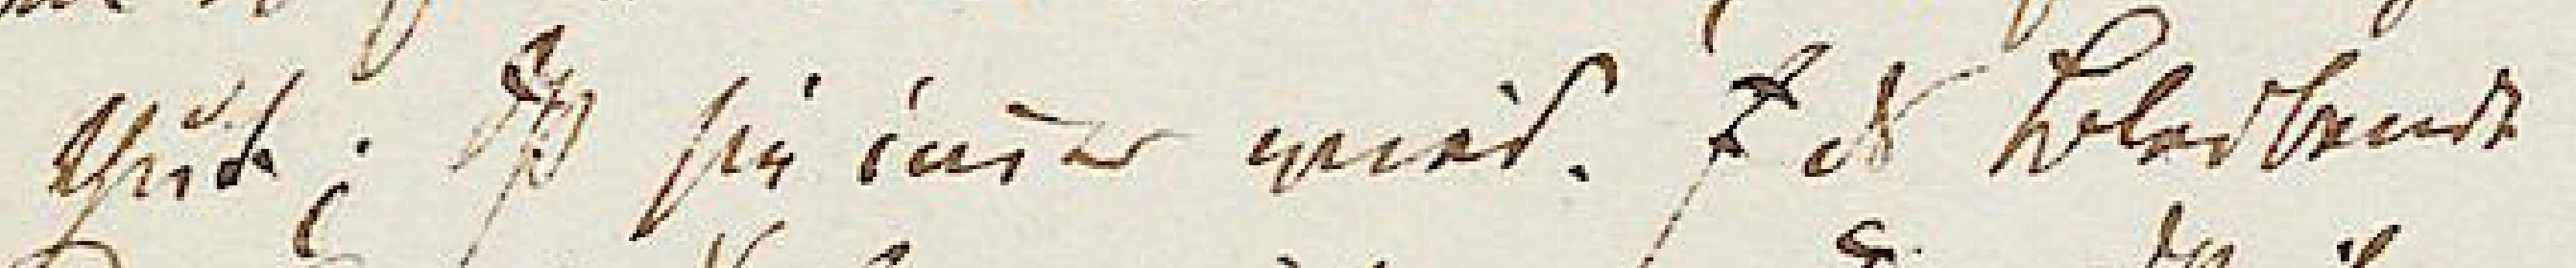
thut; Daß sie imer wied. f ds Bleibende
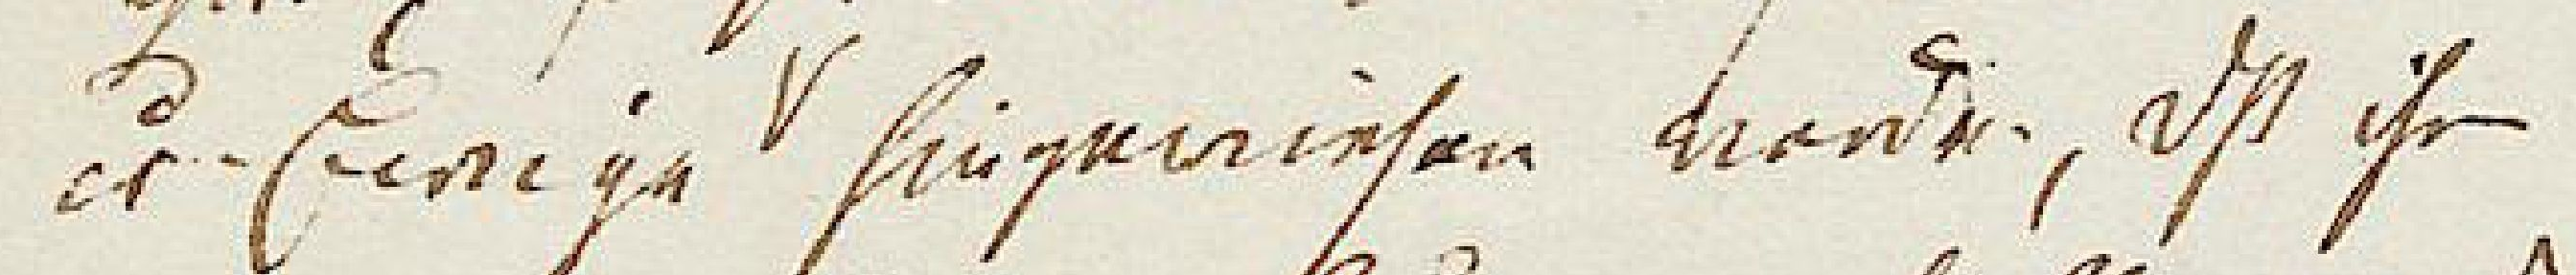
u. Ewige hingewiesen werde; Dß ihr
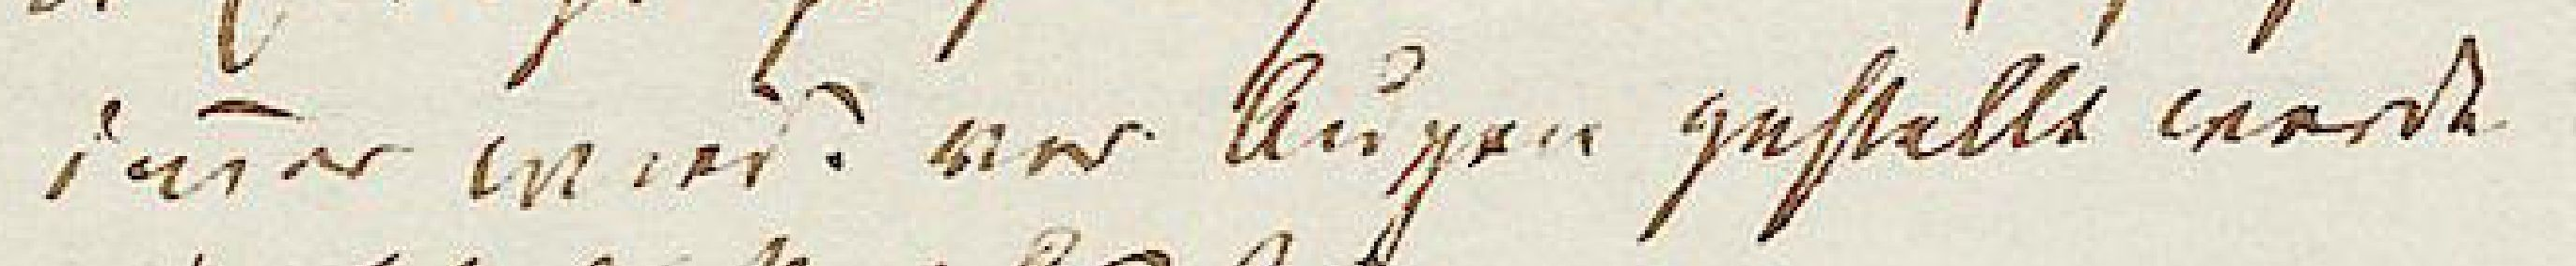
imer wied. vor Augen gestellt werde
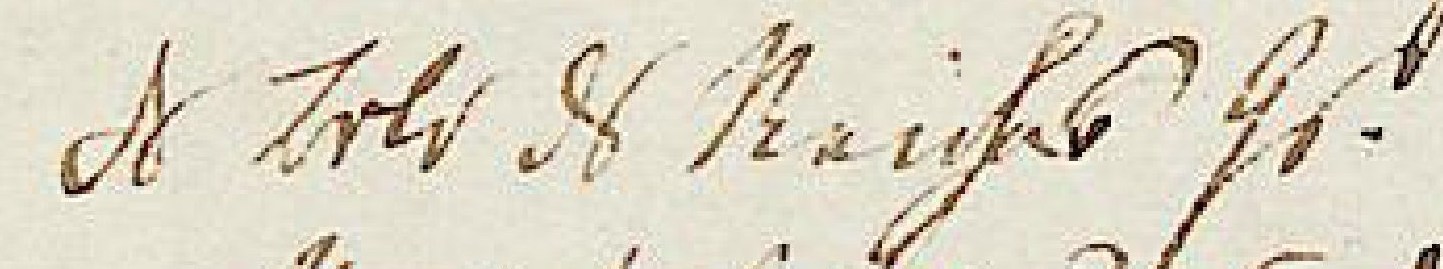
ds Bild ds Reiches Gs.
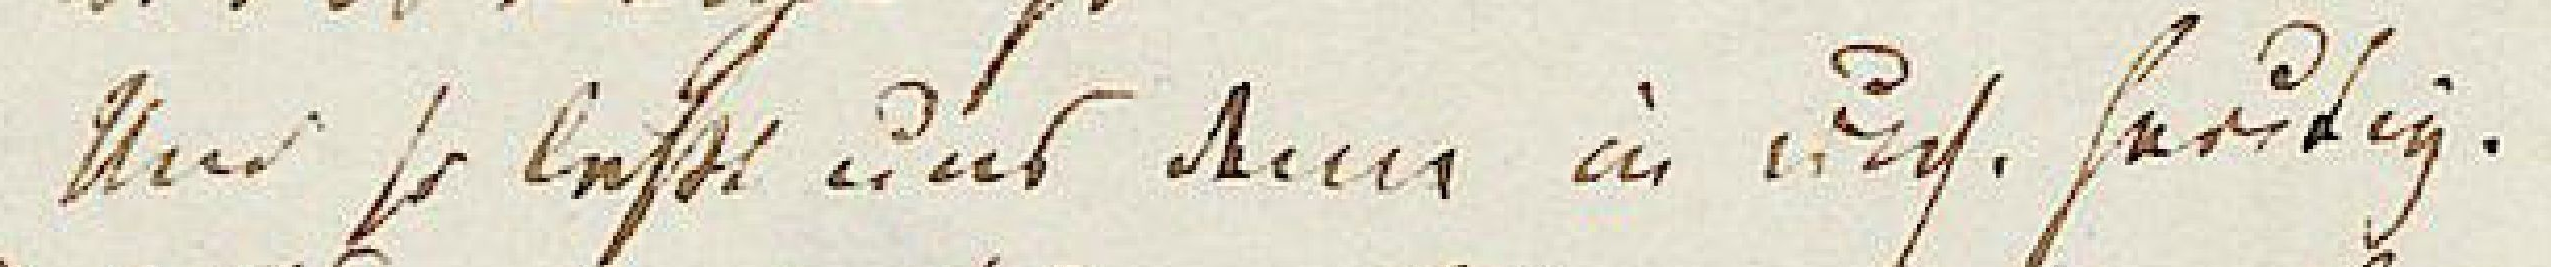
Und so laßt uns denn in uns. heutige
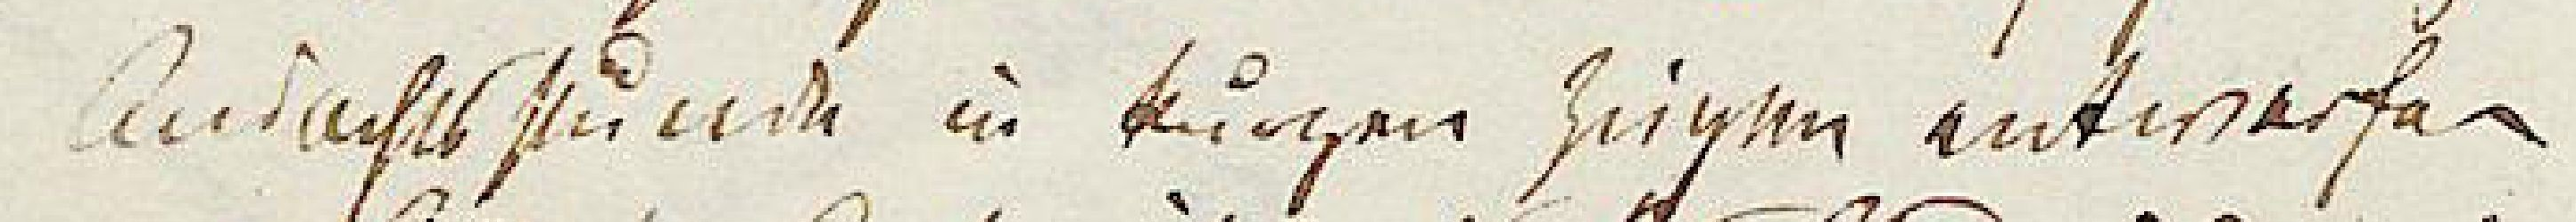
Andachtsstund in kurzen Zügen entwerfen
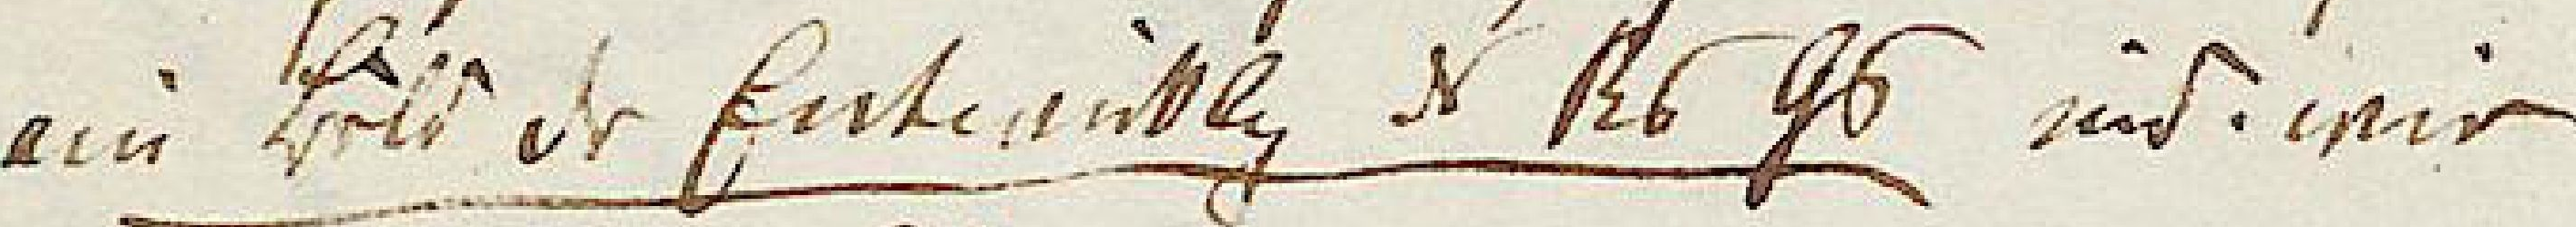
ein Bild der Entwicklg ds Rs Gs und wir
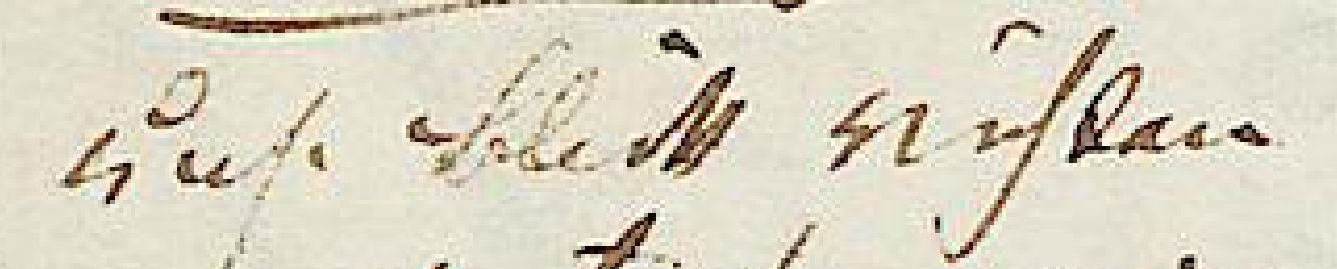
uns. Blick richten
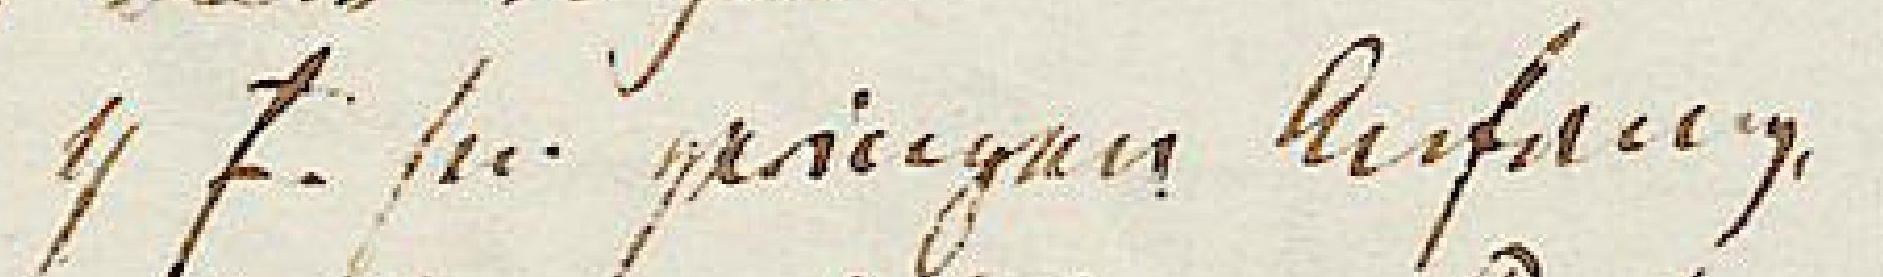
1) f sn. geringen Anfang
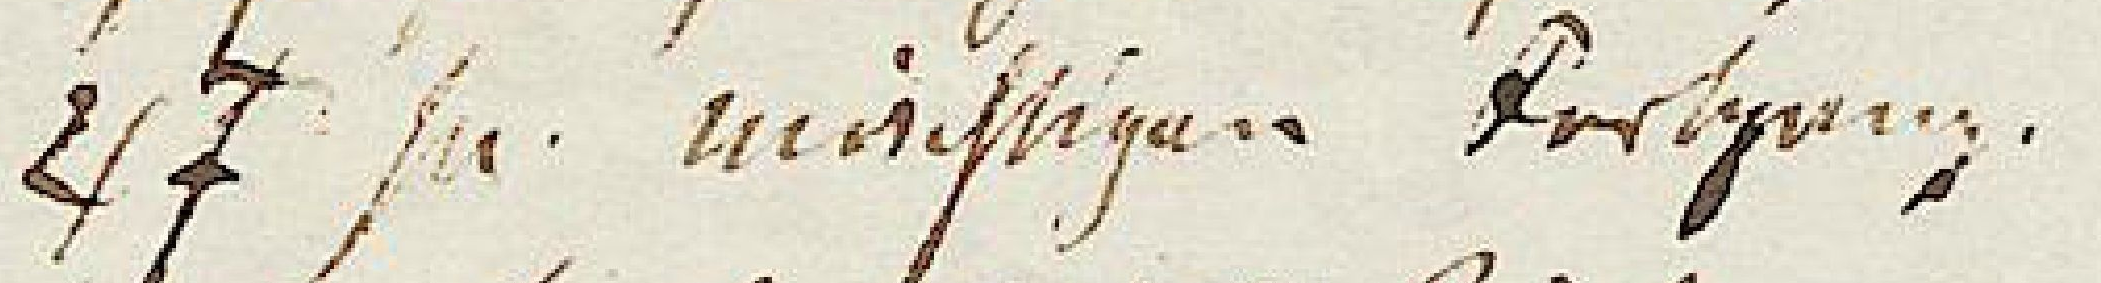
2) f sn. mächtigen Fortgang
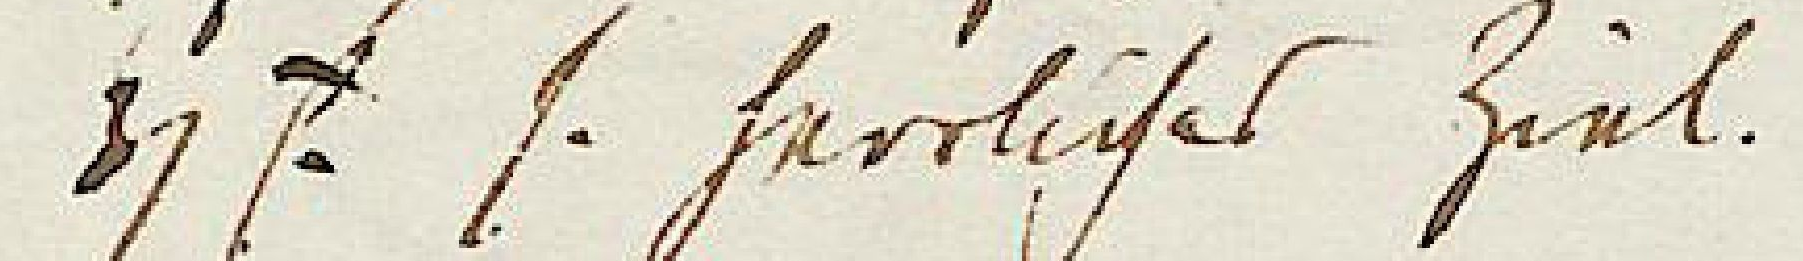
3) f s. herrliches Ziel
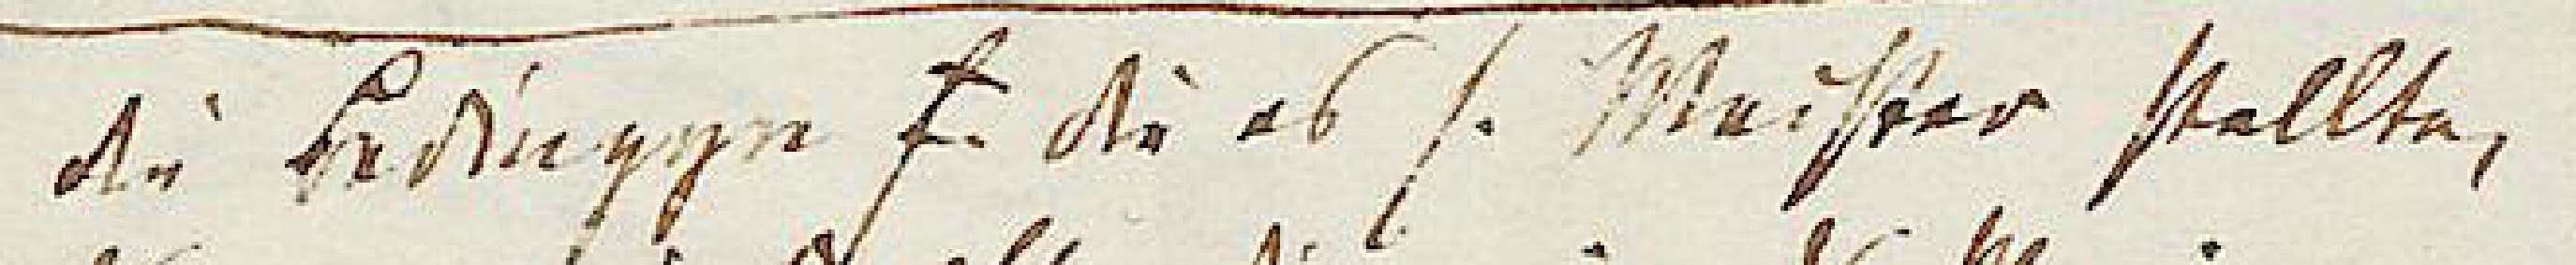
die Bedinggn f. die es s. Meister stellte,
